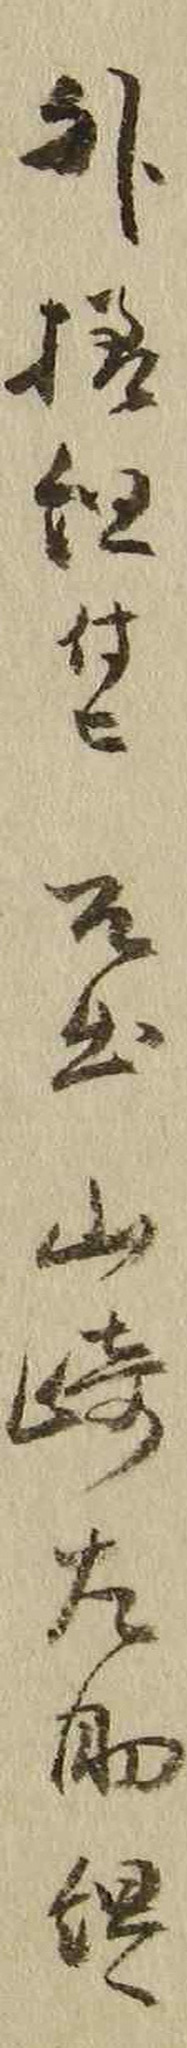外様組付被召出山崎左助組へ
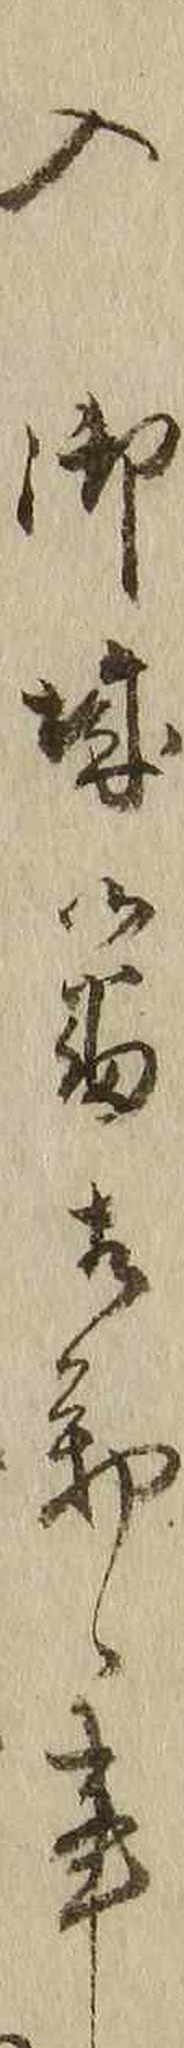入御城御番相勤候事
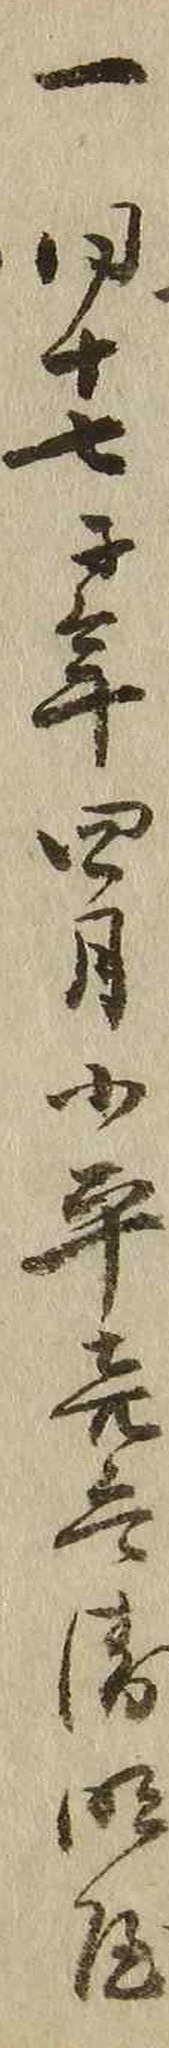一同十七子年四月小平喜兵衛明屋
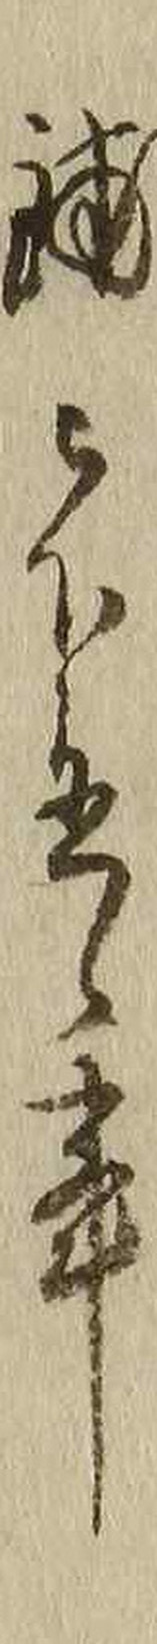鋪被下置候事
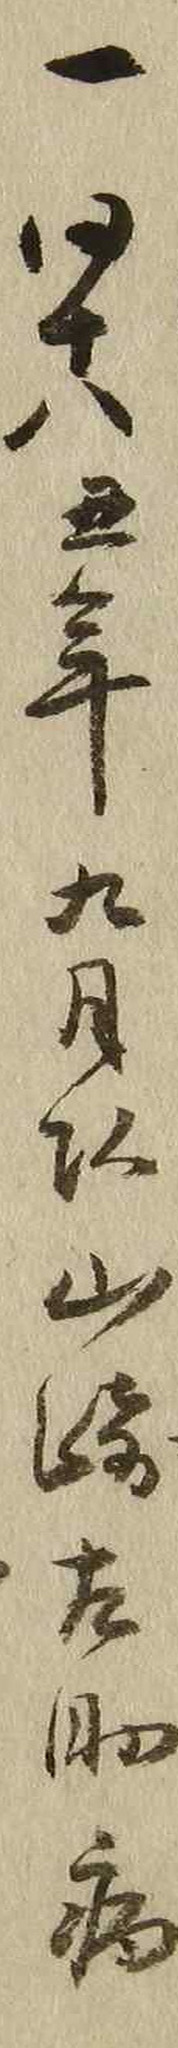一同十八丑年九月頭山崎左助病
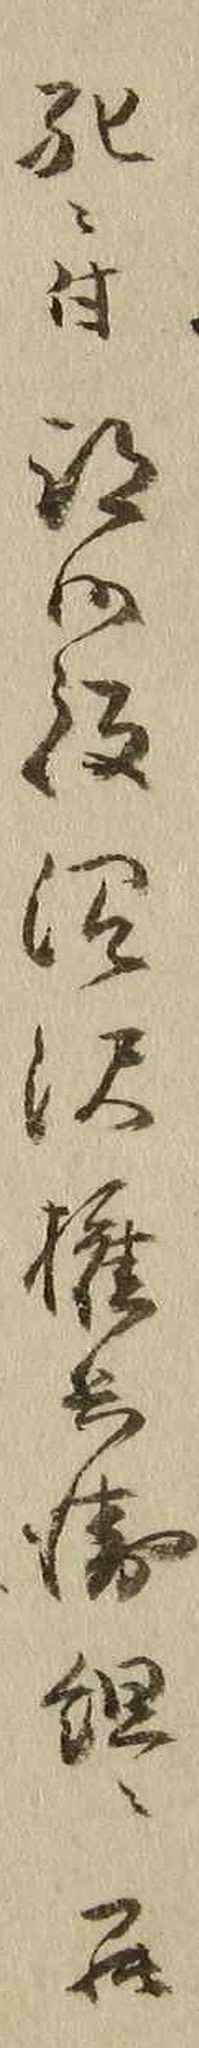死ニ付跡御役沼沢権兵衛組へ罷
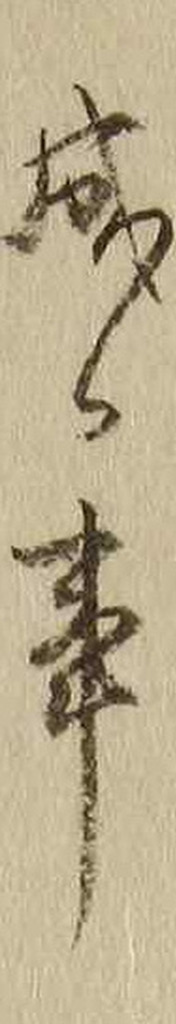成候事
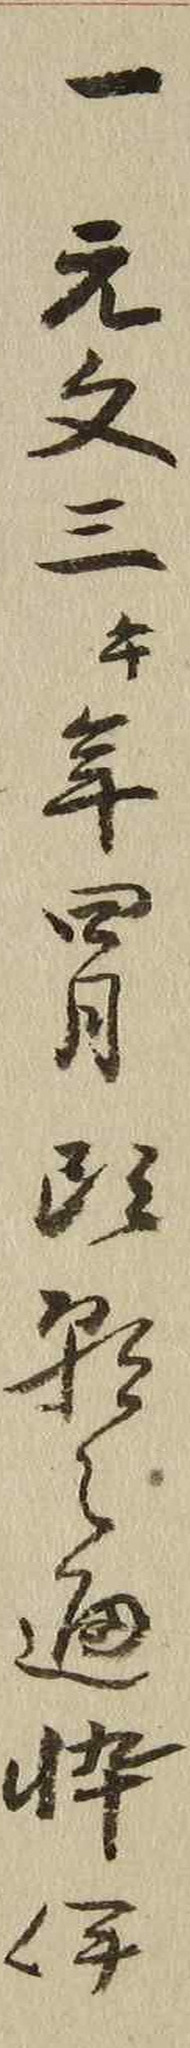一元文三午年四月頭願之通忰伊
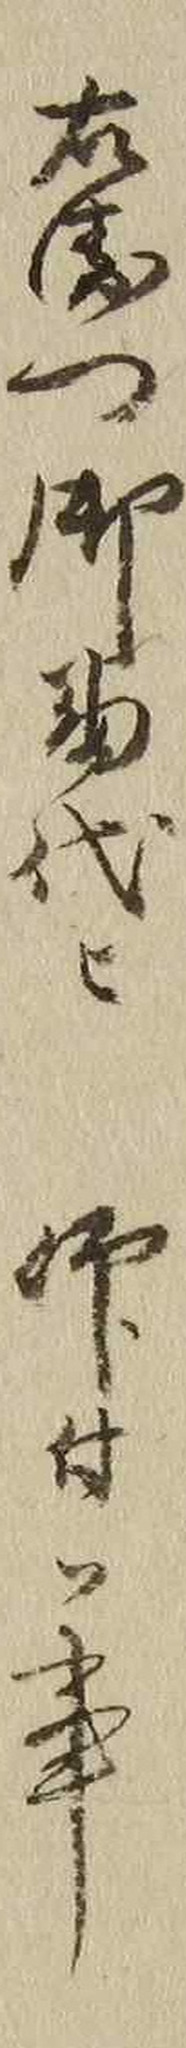右衛門御番代被仰付候事
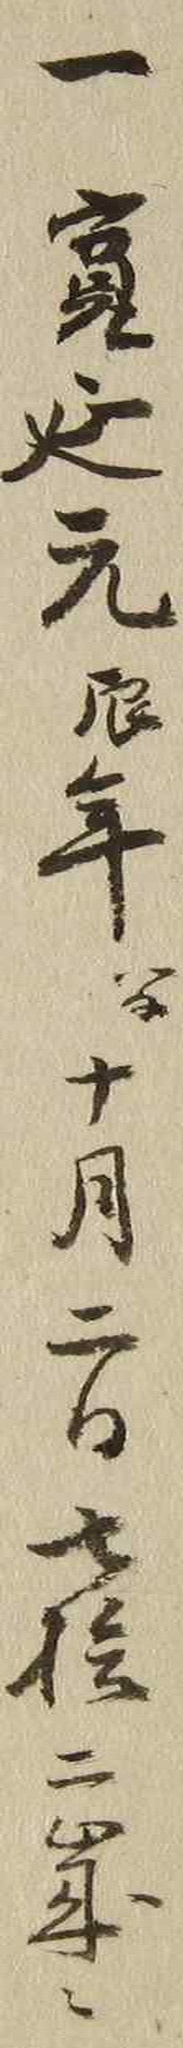一寛延元辰年閏十月二日七拾二歳ニ
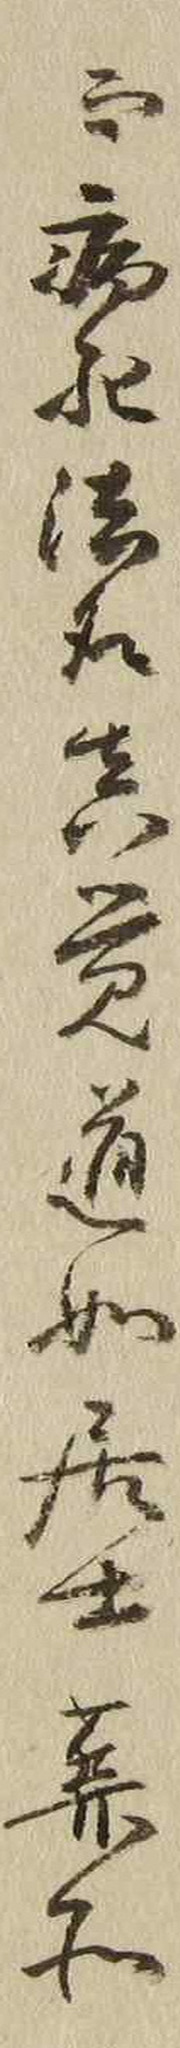而病死法名真覚道如居士葬所
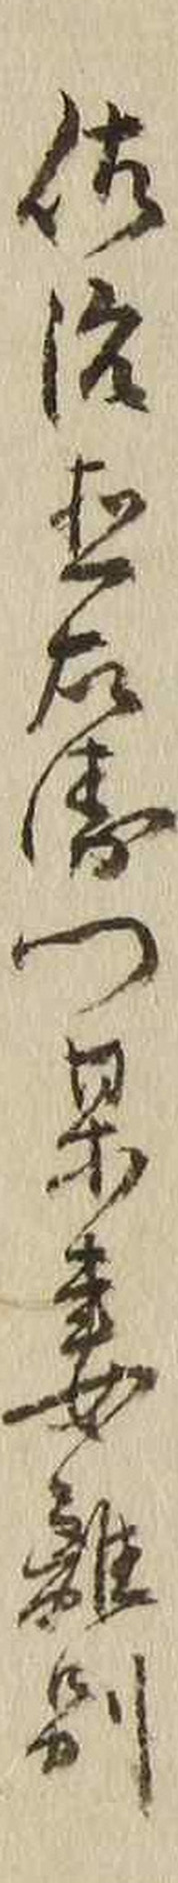佐治直右衛門某妻離別
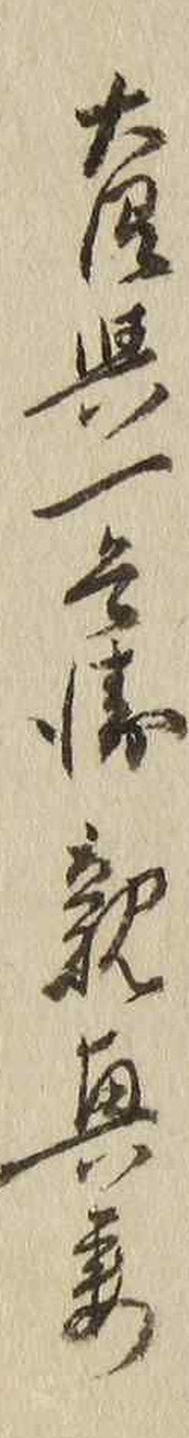女大沼与一兵衛親興妻

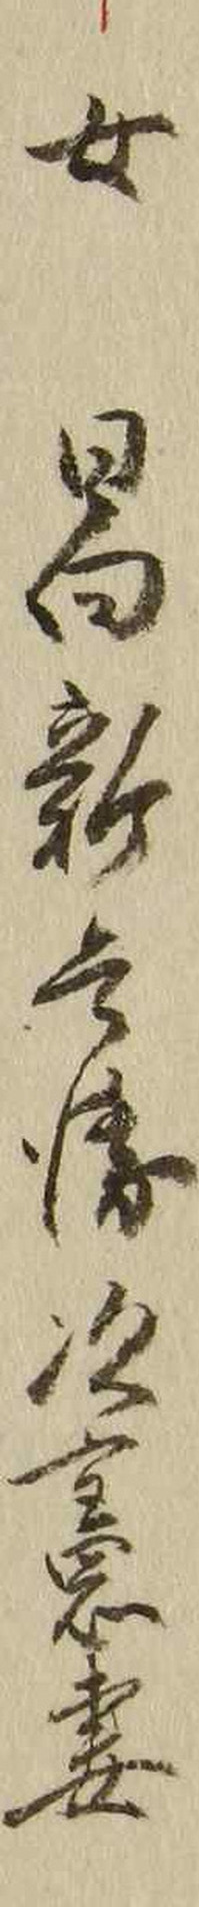女日向新兵衛次憲妻
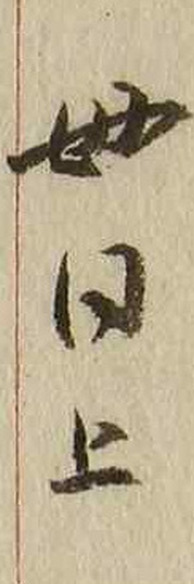母同上
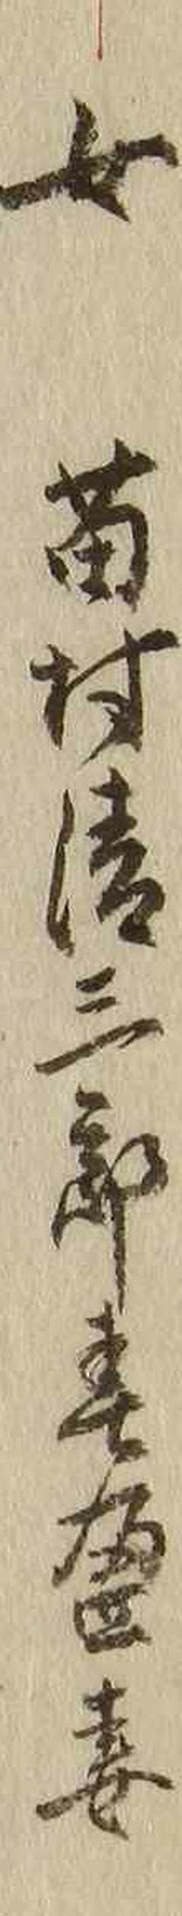女苗村清三郎春盈妻
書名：諸士系譜　巻之232　け之部1
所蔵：会津若松市立会津図書館
